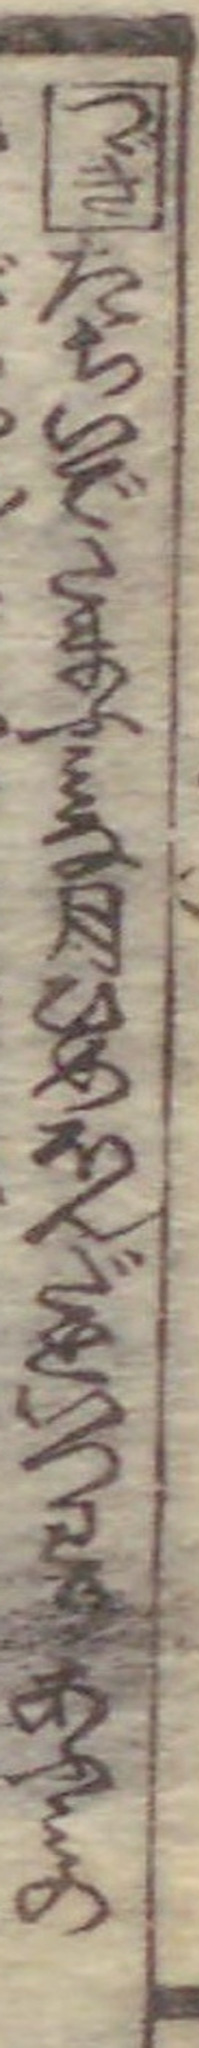つづきたちいでたまふみな月ひめほんだといつわりあふみの
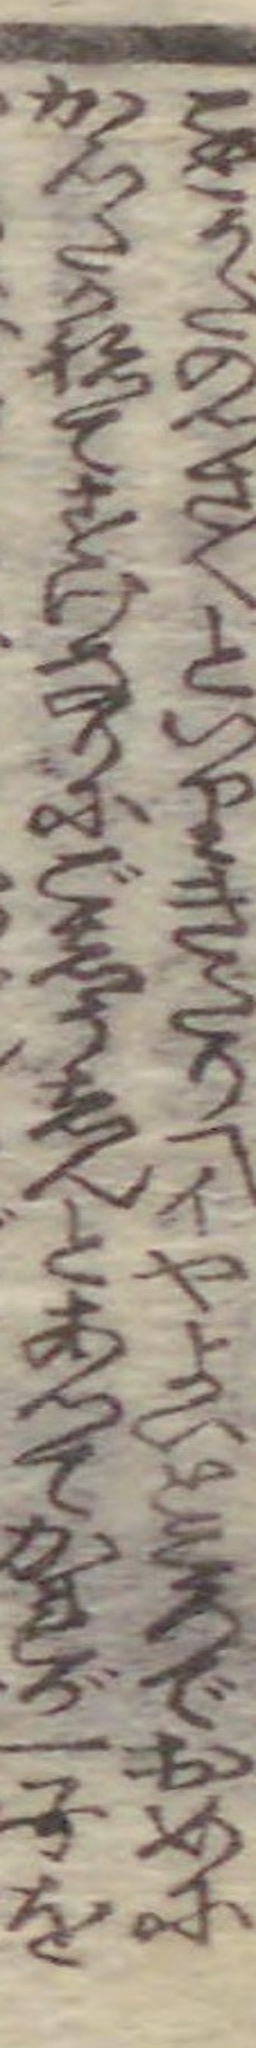かゝつたかねてすけなりにごしうしんとあつてかれが一子を
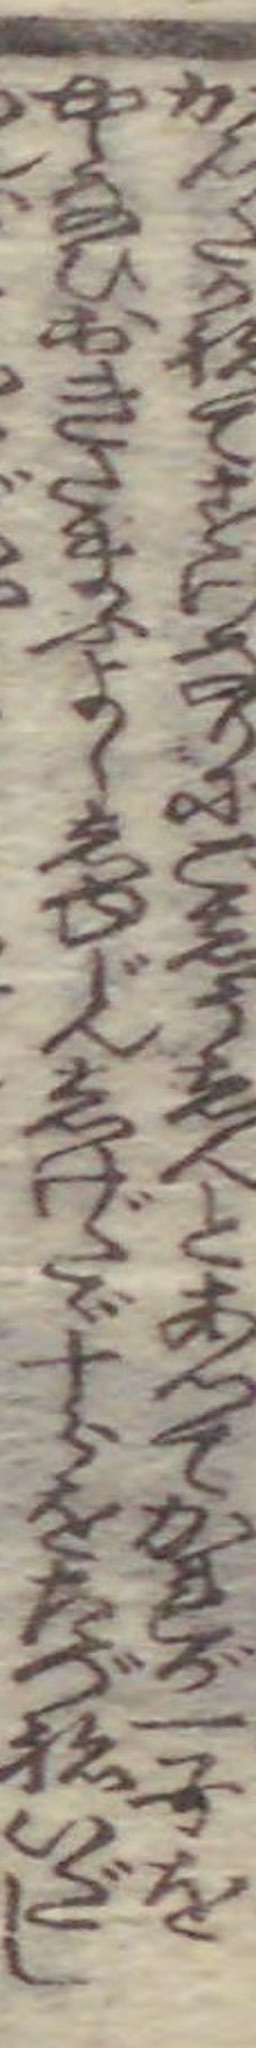やしなひおきたまふよししゆじんしげたゞ十郎をたづねいだし
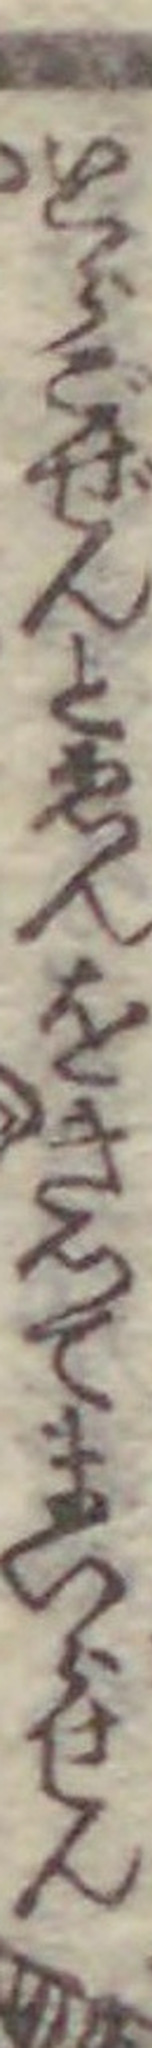とらごぜんとゑんをきつてまいらせん
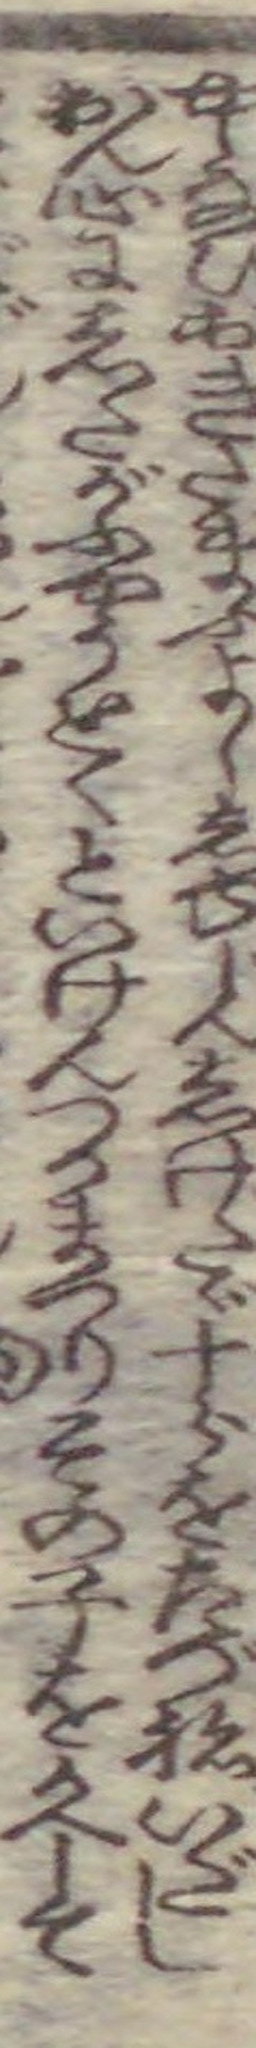おん心にしたがふやうとくといけんつかまつりその子をかへして
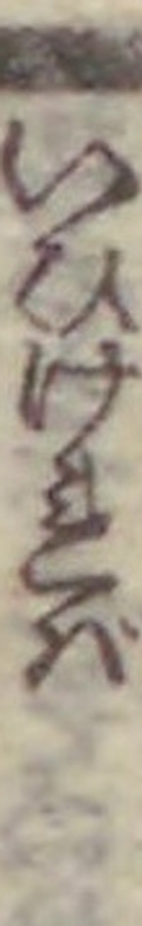いひければ
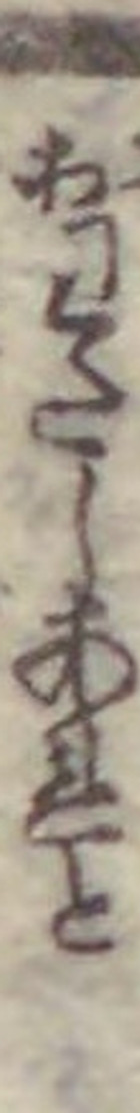おわたしあれと
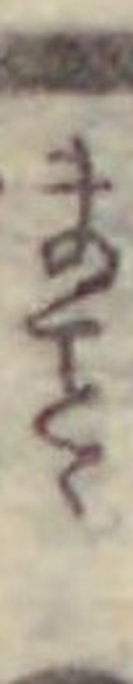まことゝ
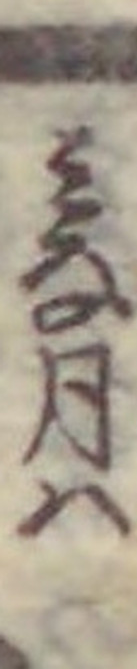みな月は
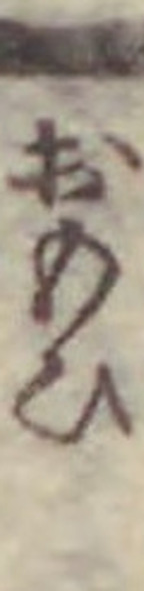おもひ
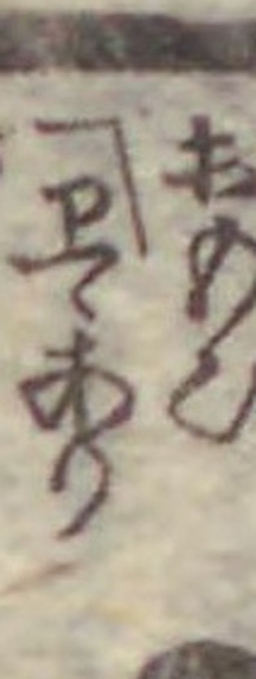〽ヱヽあり
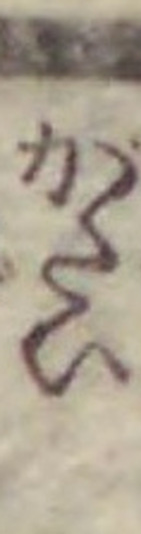がたい
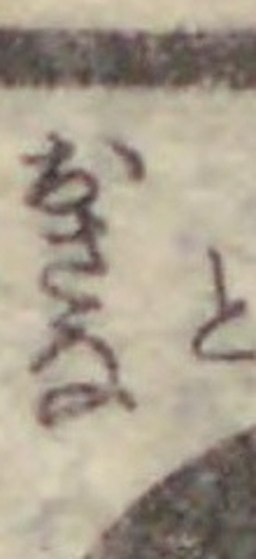おさな
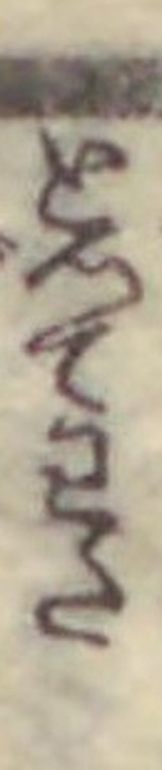とつてわた
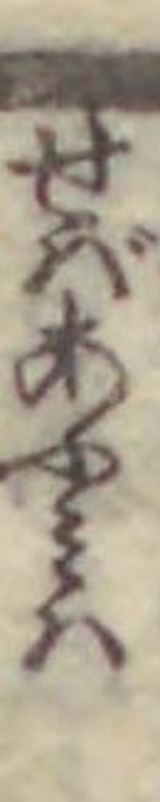せばあふみは
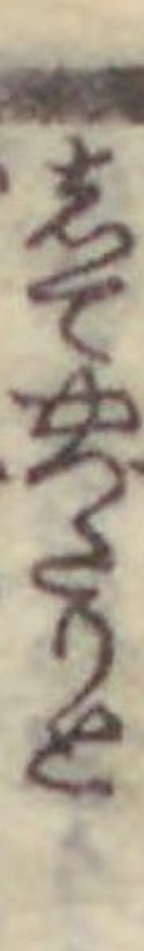してやつたりと
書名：大時代唐土化物 3巻. 曽我太夫染
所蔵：国立国会図書館 National Diet Library, JAPAN
